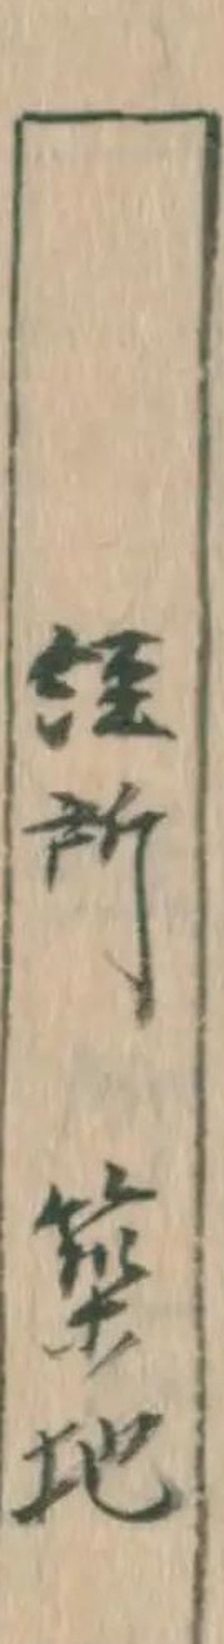経所築地
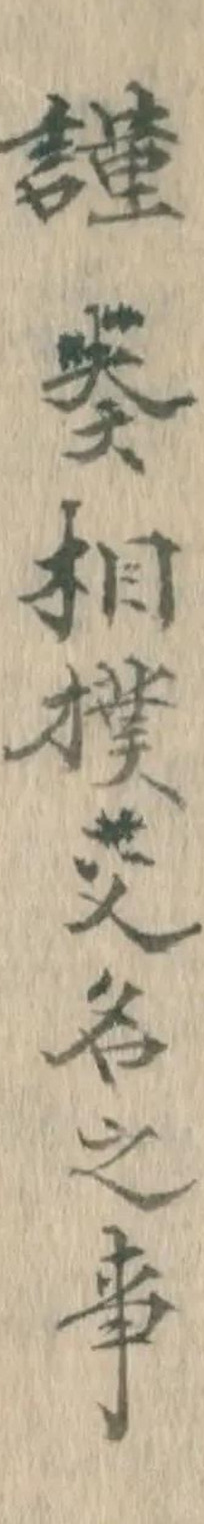謹奏相撲交名之事

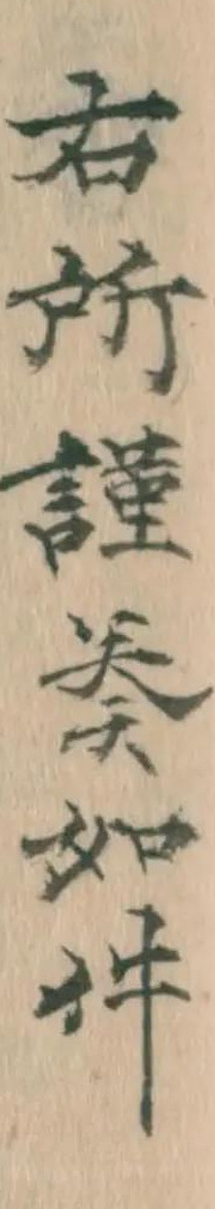右所謹奏如件
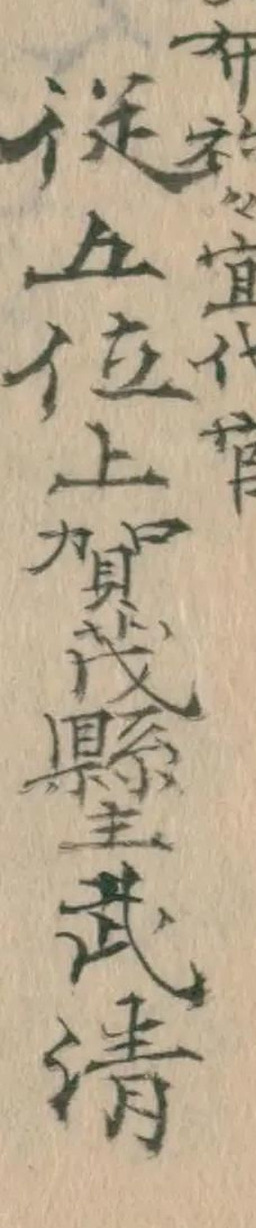従五位上賀茂県主武清
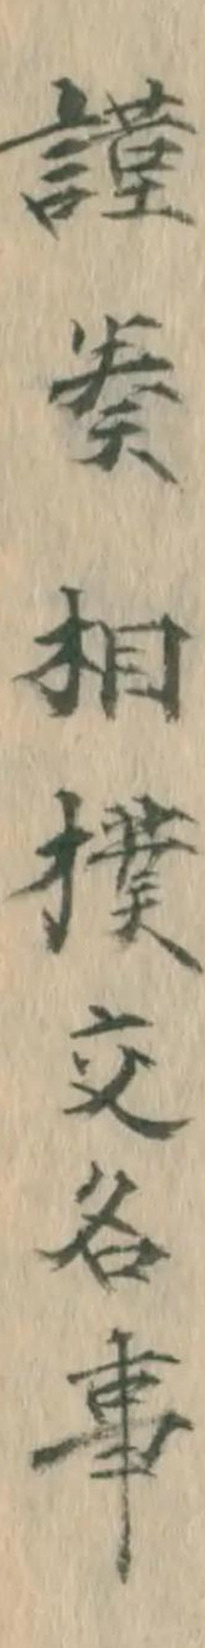謹奏相撲交名事

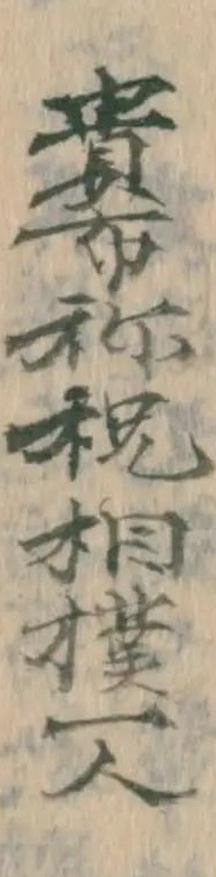四番正祝相撲一人
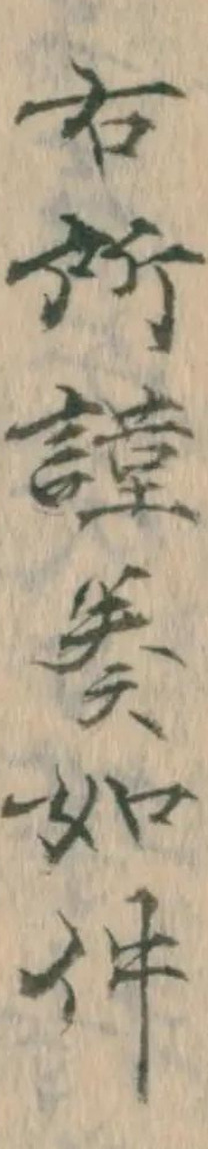右所謹奏如件
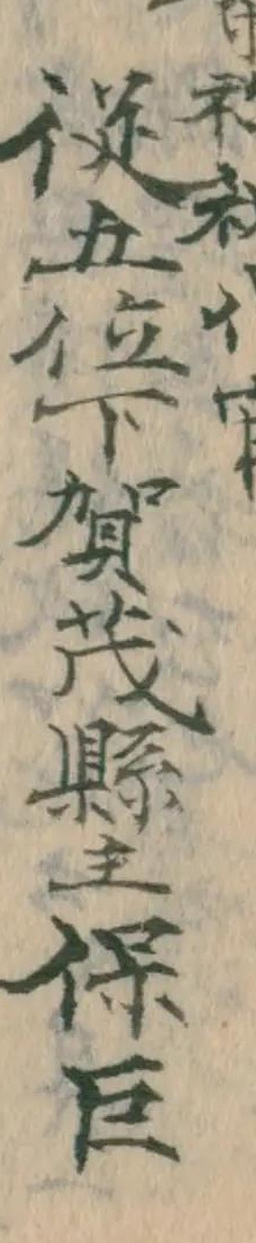従五位下賀茂県主保巨

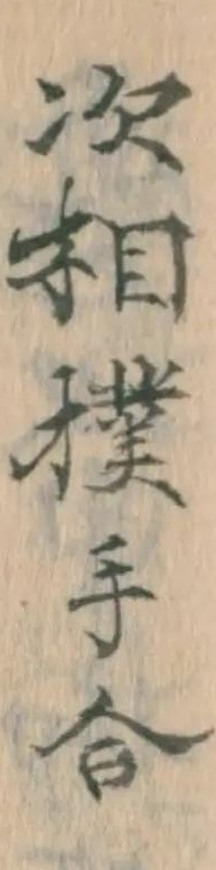次相撲手合
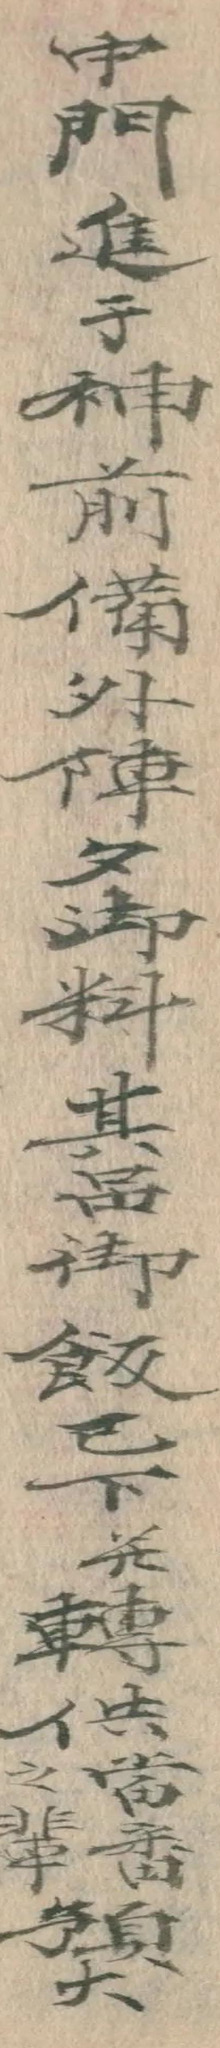中門進于神前備外陣夕御料其品御飯已下并転供当番之輩預大

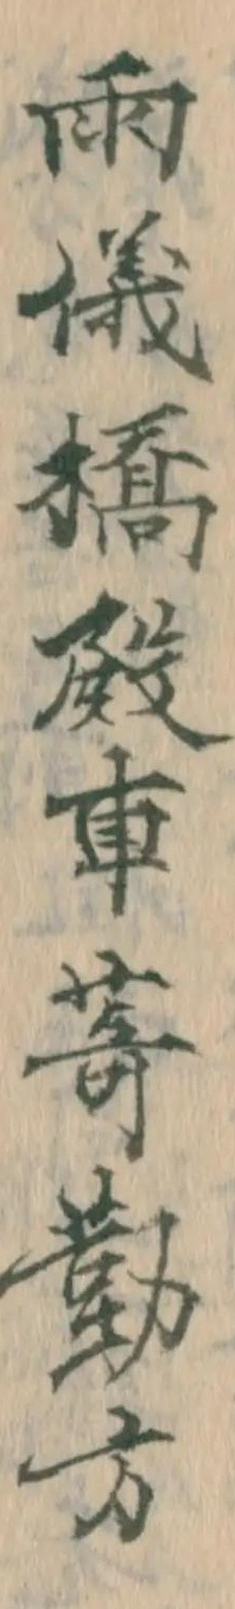雨儀橋殿車寄勤方
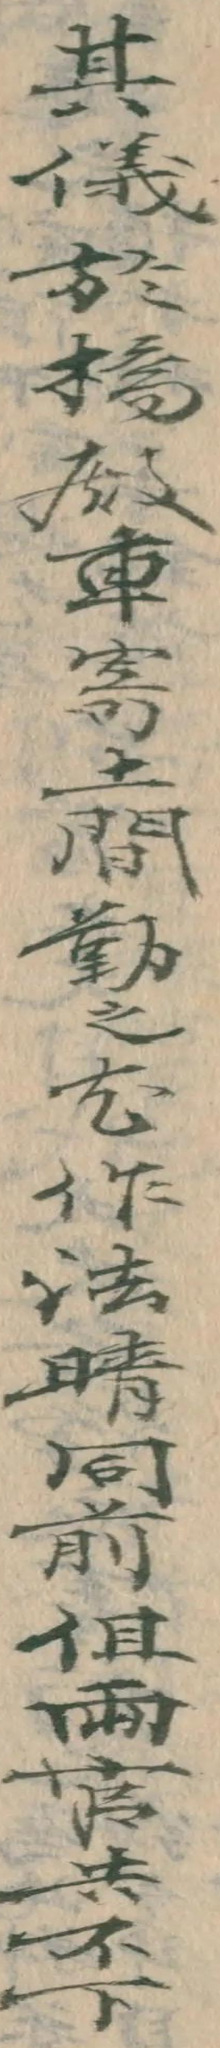其儀於橋殿車寄土間勤之尤作法晴同前但両官共不下
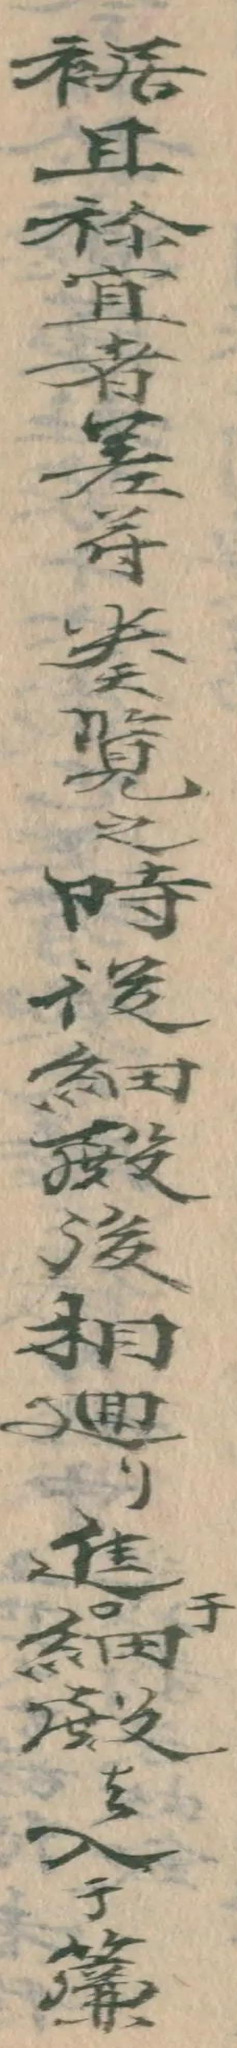裾且祢宜者差符奏覧之時従細殿後相廻リ進◦細殿入于簾
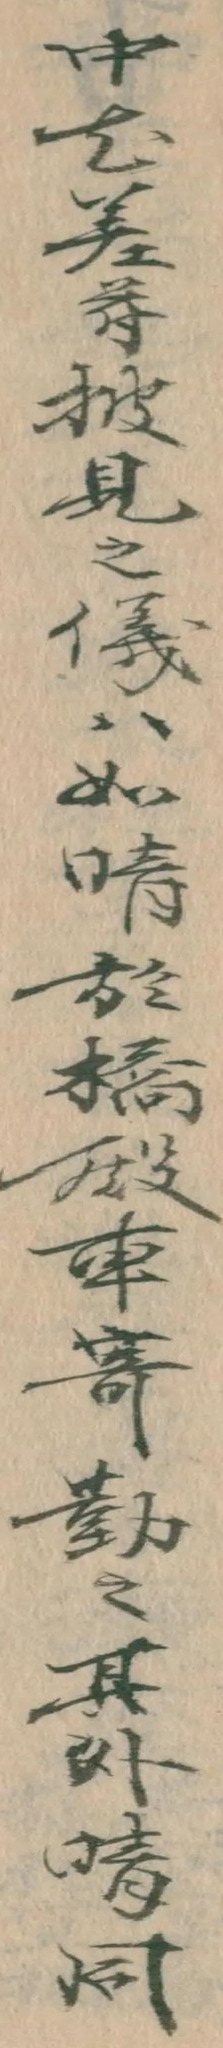中尤差符披見之儀ハ如晴於橋殿車寄勤之其外晴同
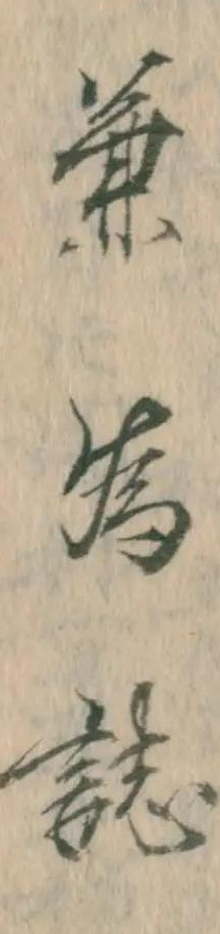兼為誌
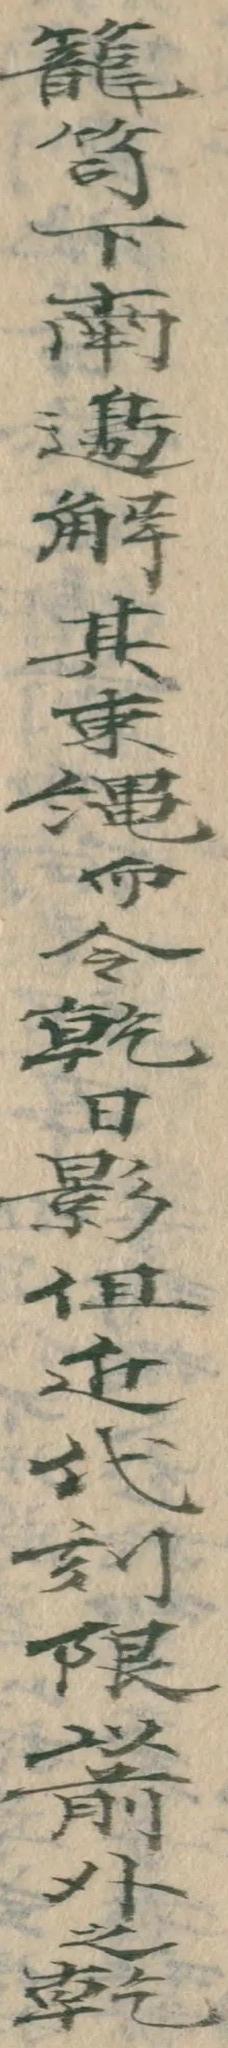籠笥下南辺解其束縄而令乾日影但近代刻限以前外之乾
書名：賀茂社記録. 第9冊
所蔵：国立国会図書館 National Diet Library, JAPAN
